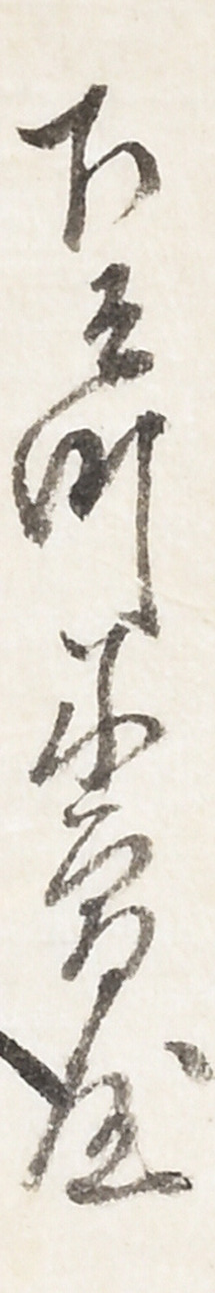下モ町木曽屋
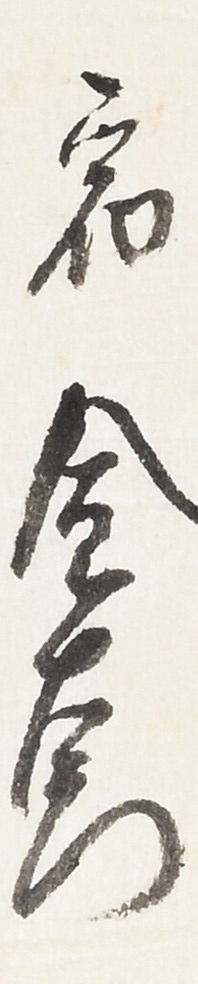宿金右衛門
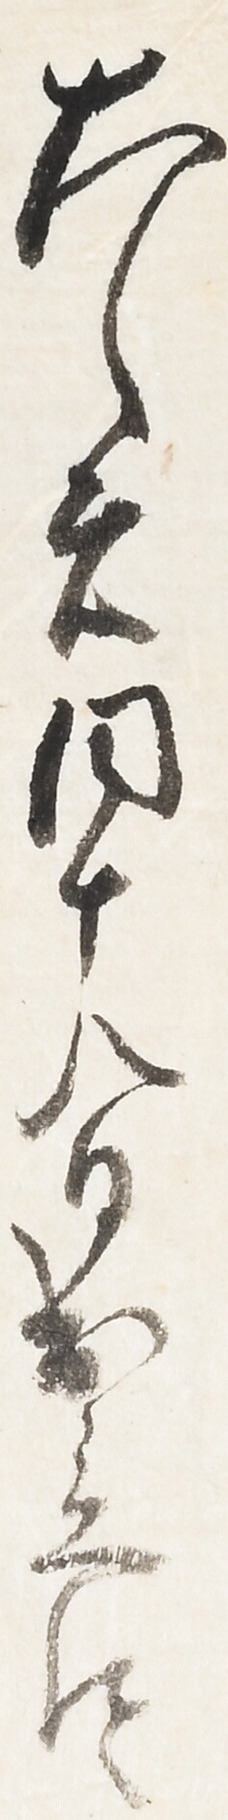右之者同壱八日出立仕候
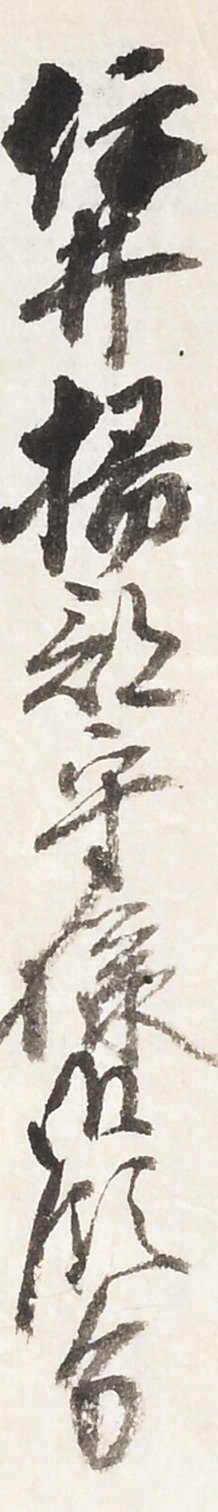井伊掃部守様御領分
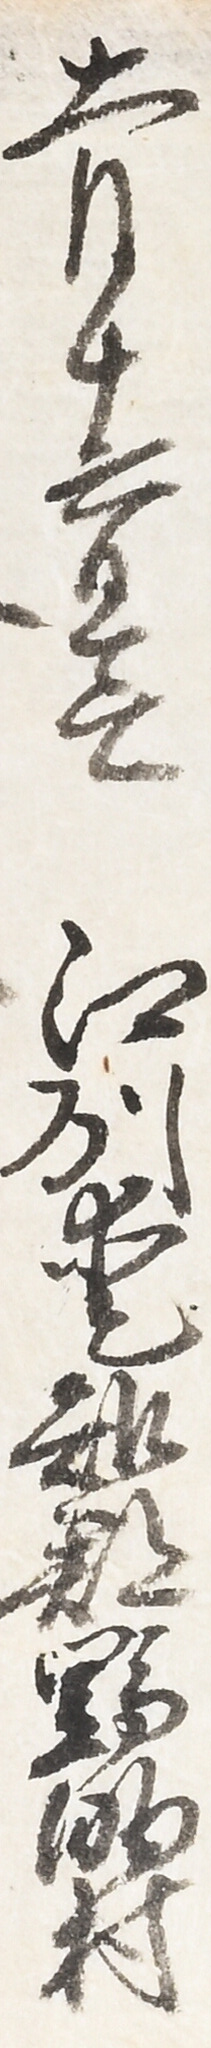十一月十六日着江州愛知郡野明村
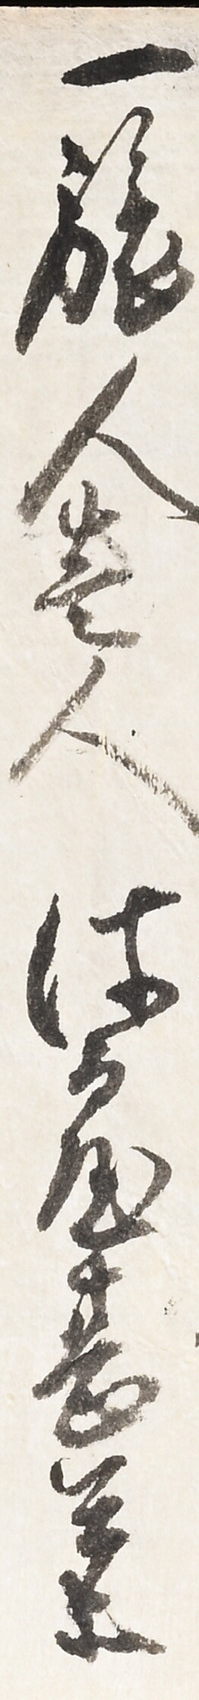一旅人壱人は而屋甚兵衛
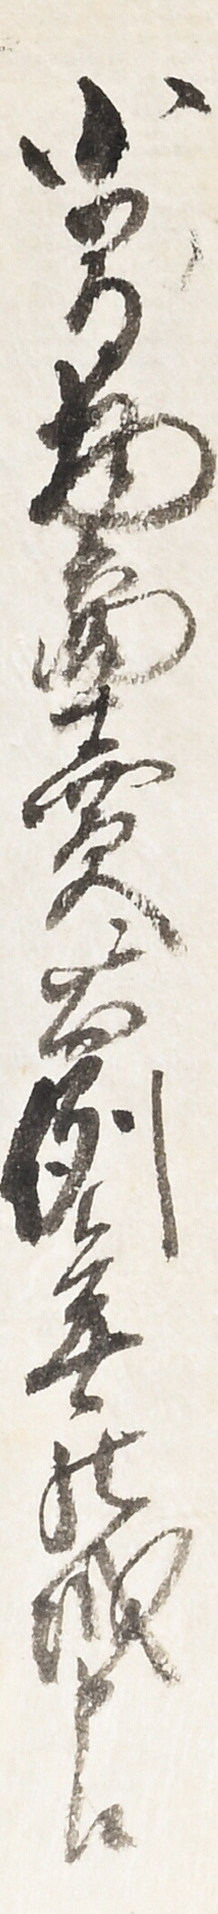小間物商売ニ而例年罷越申候
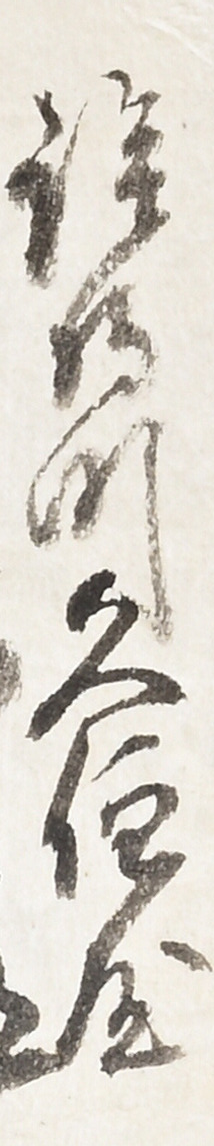鉾持町久住屋
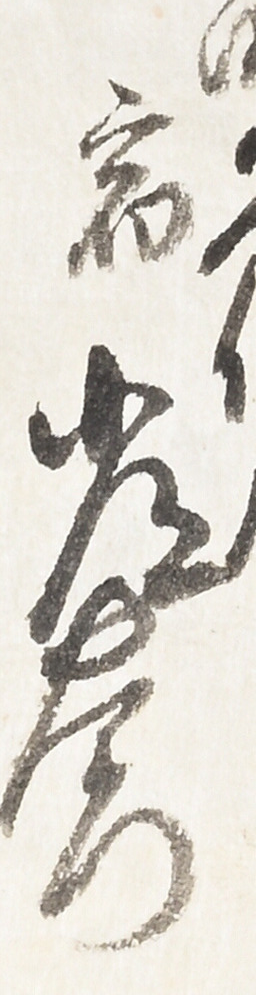宿常右衛門
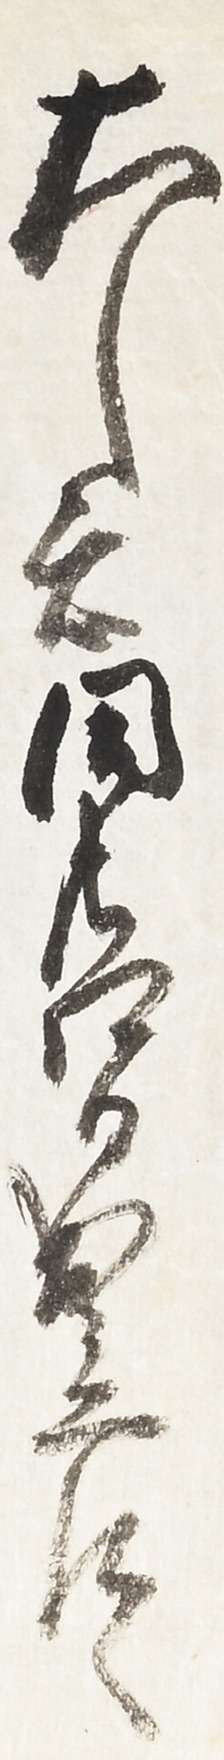右之者同廿四日出立仕候
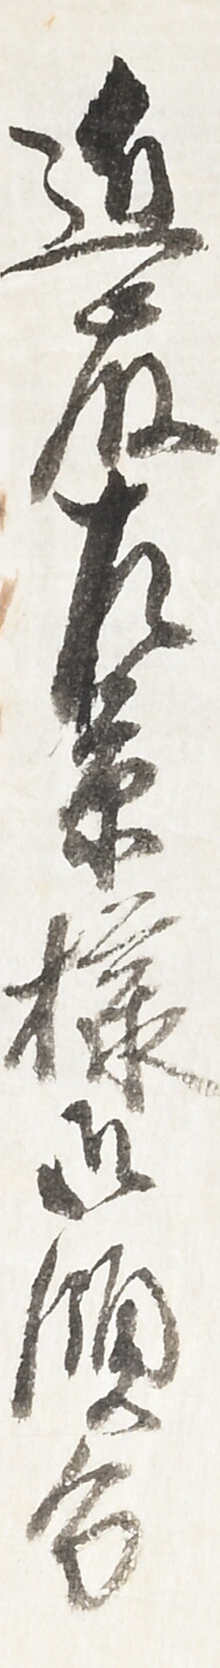近藤左京様御領分
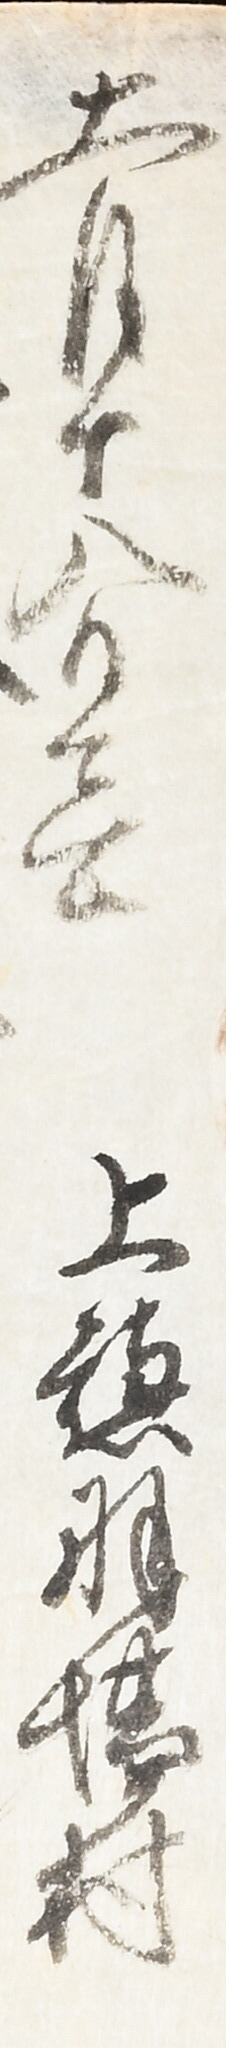十一月十八日着上穂羽場村
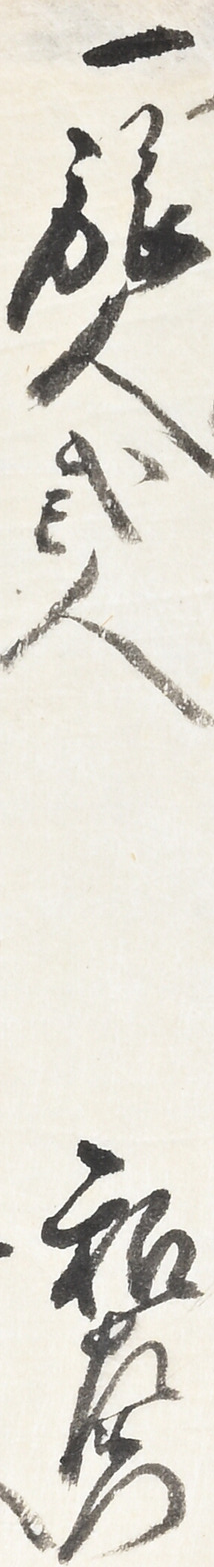一旅人弐人和左衛門
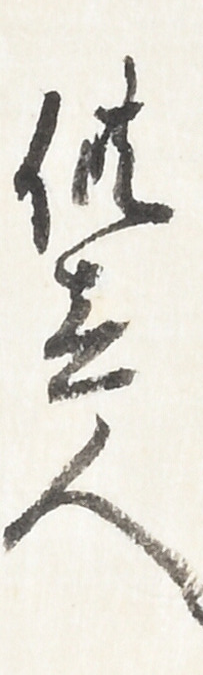供壱人
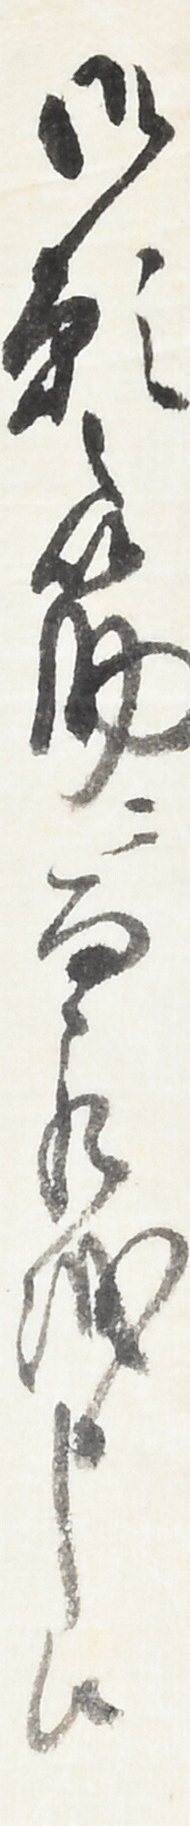御願之筋ニ而罷越申候
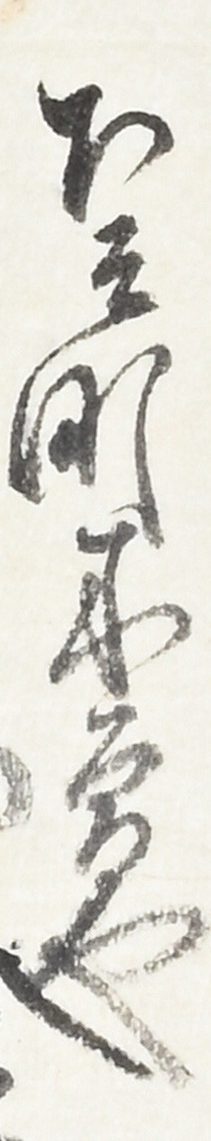下モ町木曽屋
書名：旅人泊控帳
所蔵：伊那市立高遠町図書館・合同会社AMANE
